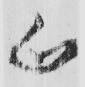㠯（以）
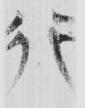行
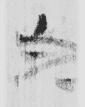之
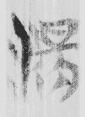湯
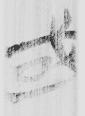或
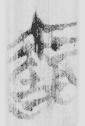{尒䎽}
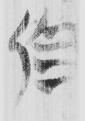於
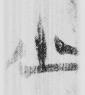少
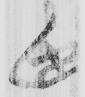臣
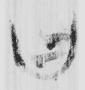曰
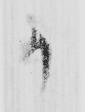人
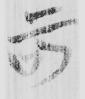可
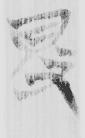𠭁
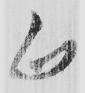㠯（以）
